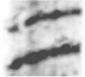二
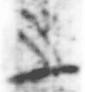之
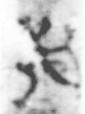旗
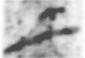一
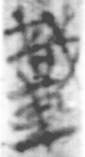載
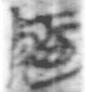○（西）
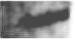一
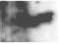一
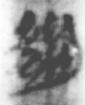○（絶）
